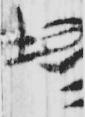坦坦
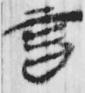胃（謂）
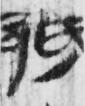○（鄢）
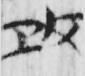攻
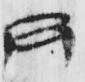尹
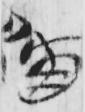○（屈）
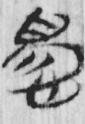惕
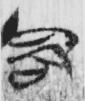命
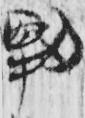解
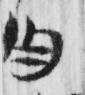舟
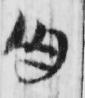舟
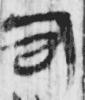司
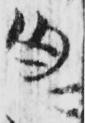舟舟
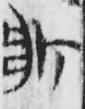斨
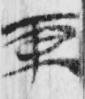車
